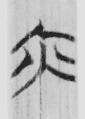亦
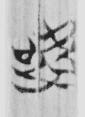{足欠}
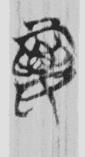婁
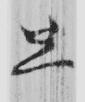也
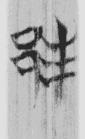邦
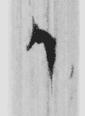人
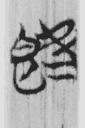既
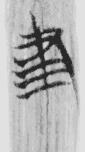𦘔
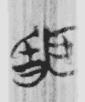䎽
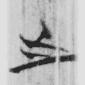之
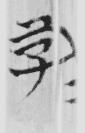乳=
